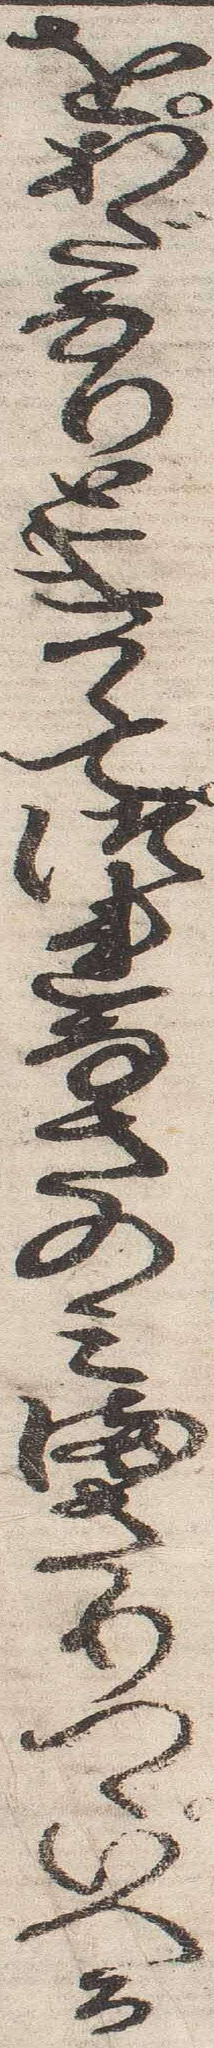を。あだなりときゝて。つれなさのみまさりつゝ。いへる
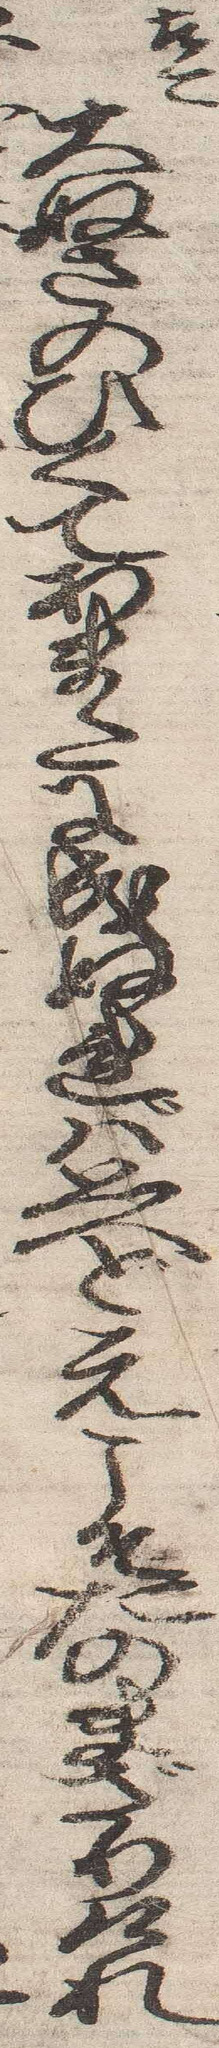古今大ぬさのひくてあまたに成ぬれば思へとえこそたのまざりけれ
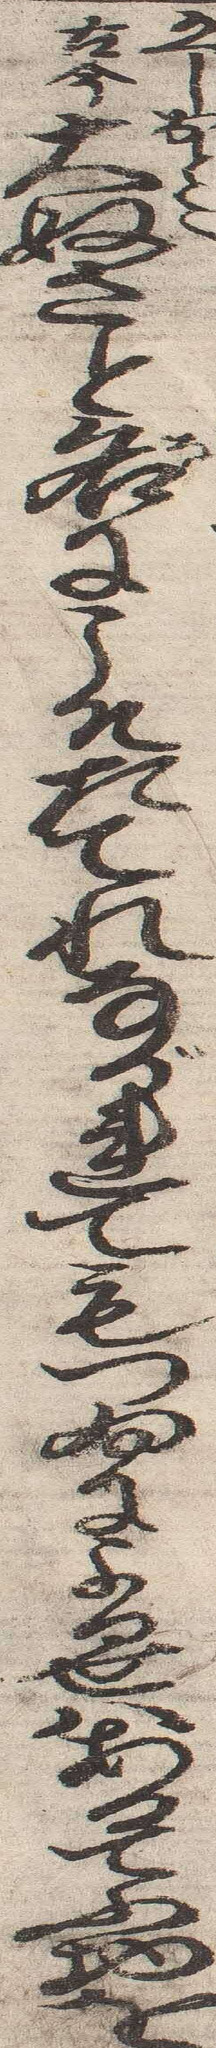古今大ぬさと名にこそたてれながれてもつゐによるせはあるてふ物を
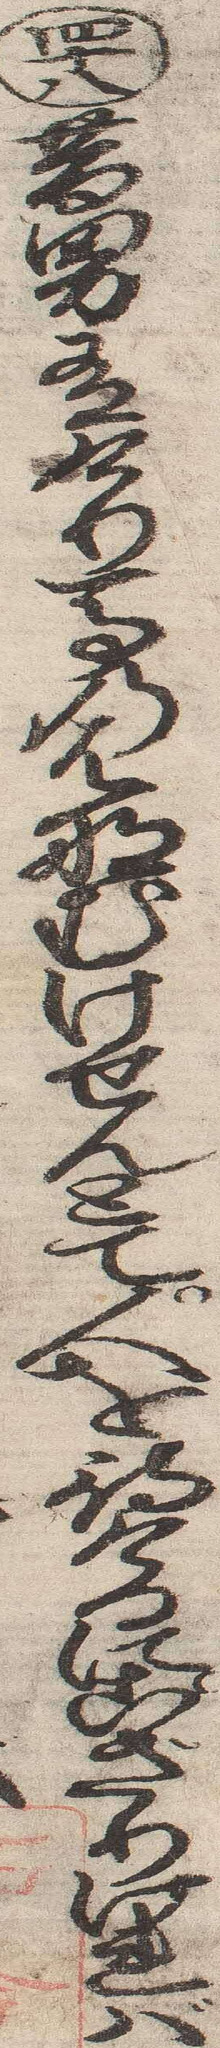四十八昔男有けり馬のはなむけせんとて。人を待けるに。こざりければ
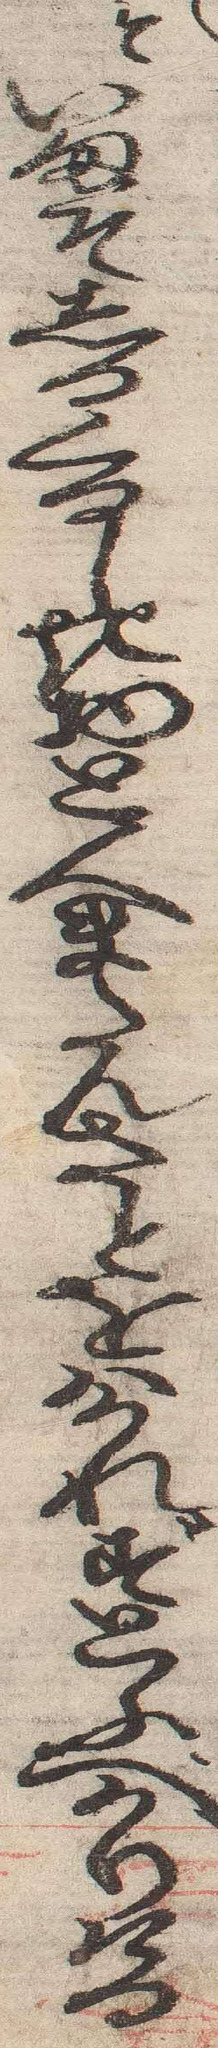古今いまそしるくるしき物と人またんさとをはかれずとふべかりける
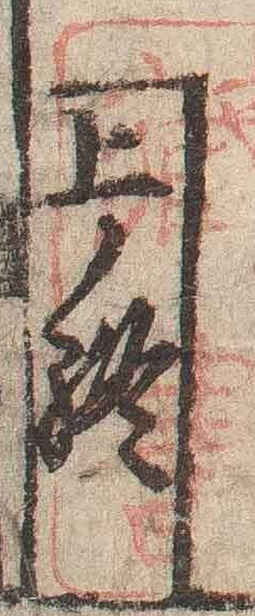上ノ終

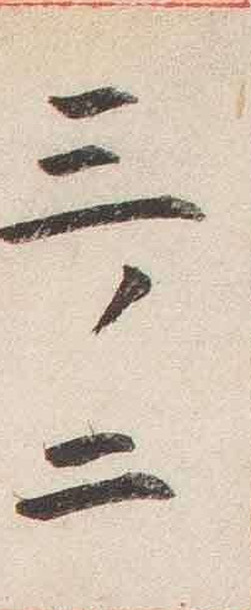三ノ二
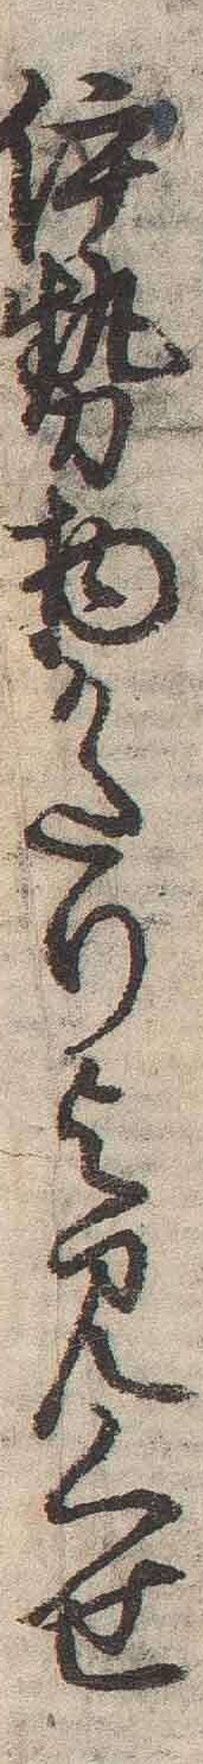伊勢物かたりよみくせ
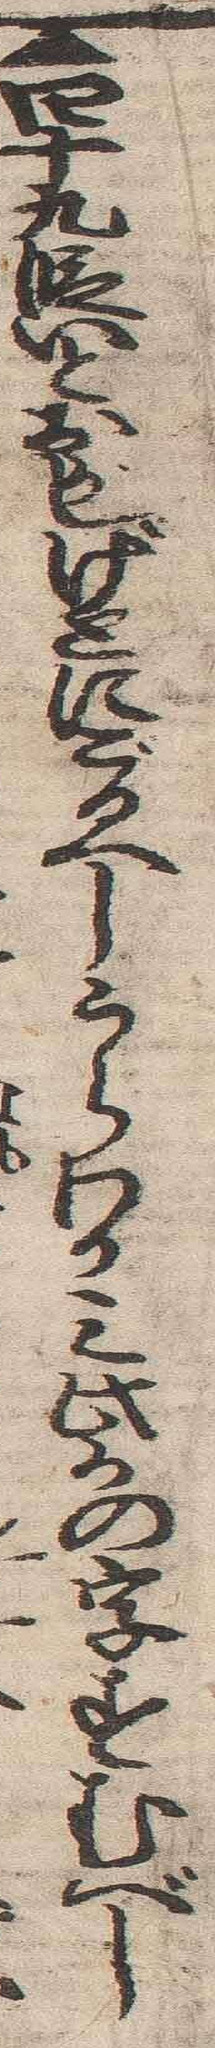▲四十九段いとおかしげとにごるへしうらわかみ此かの字すむべし
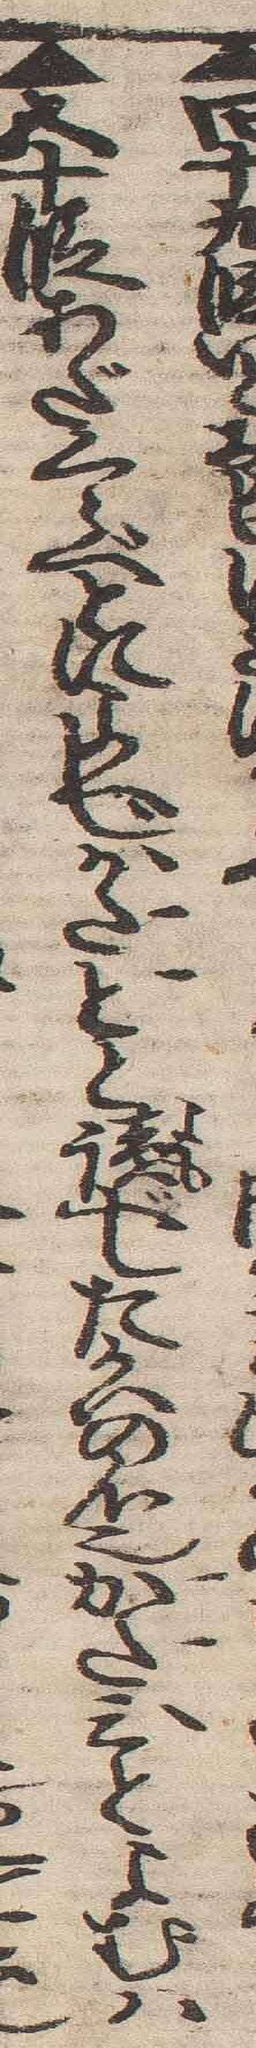▲五十段あだくらべとにこるへしかたとと読べしたかいの心也かたみとよむは
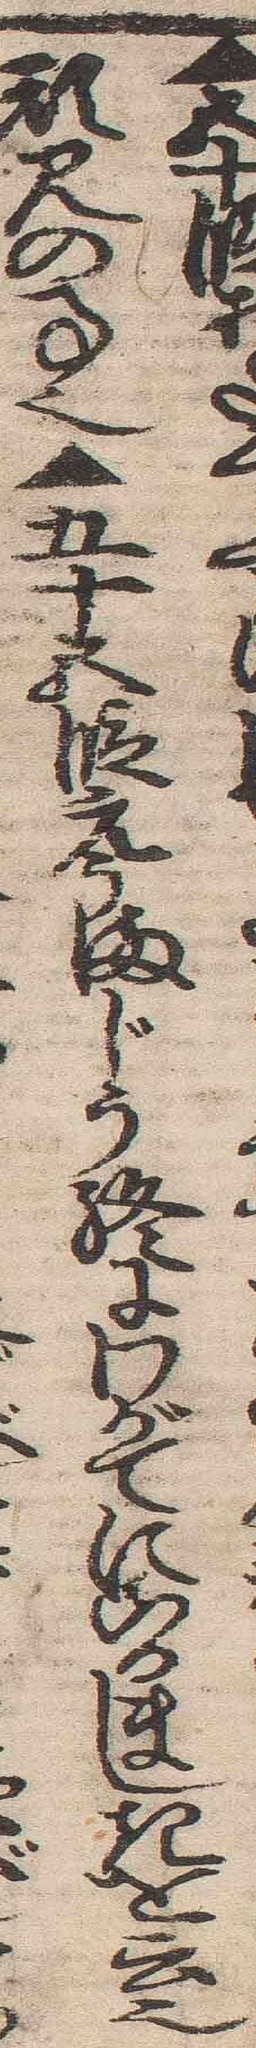顔見の事也▲五十五段えうまじう終にわがてにいるましきを云也
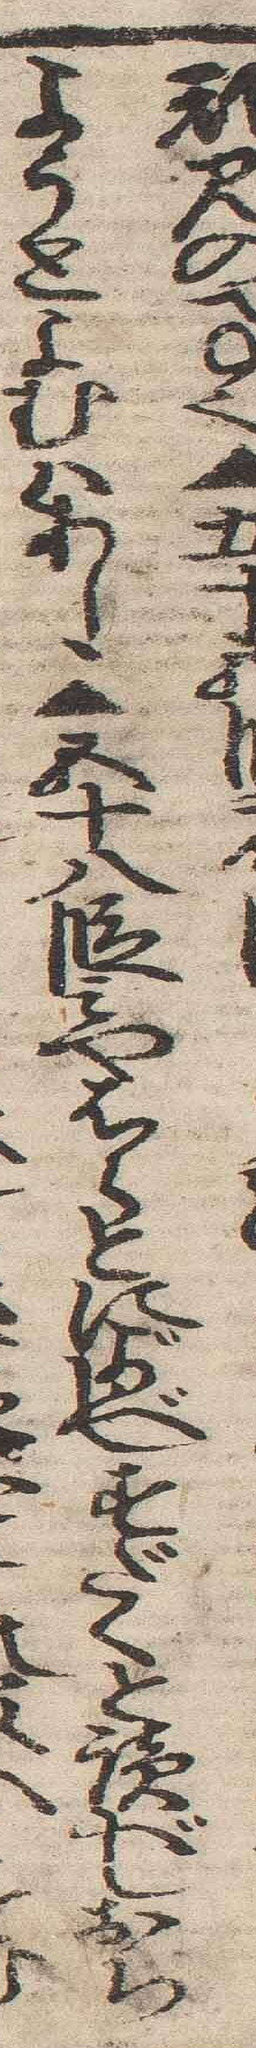ようとよむはあしゝ▲五十八段みやはらとにごるべしすだくと読べしおち
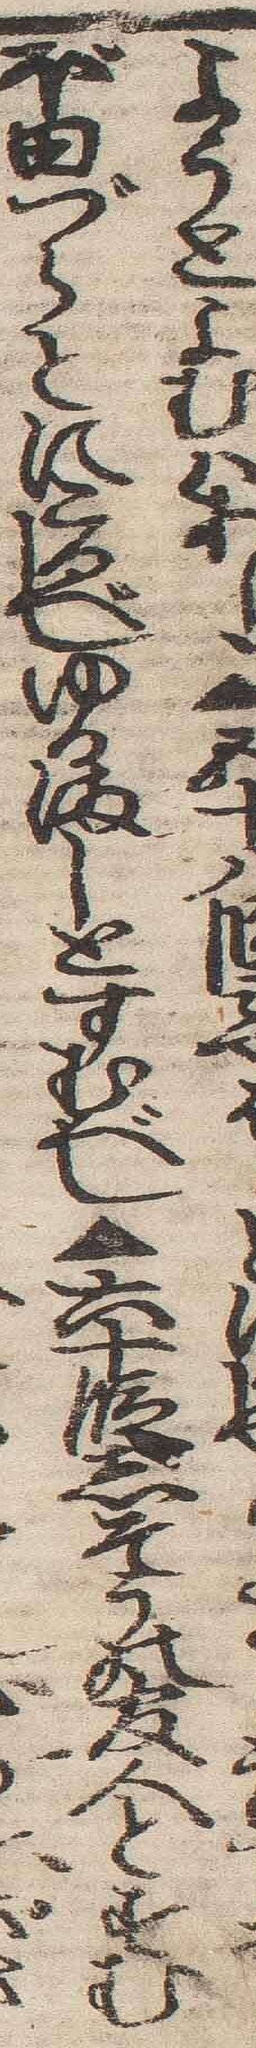ぼ田づらとにこるべしゆかましとすむべし▲六十段しそうの官人とすむ
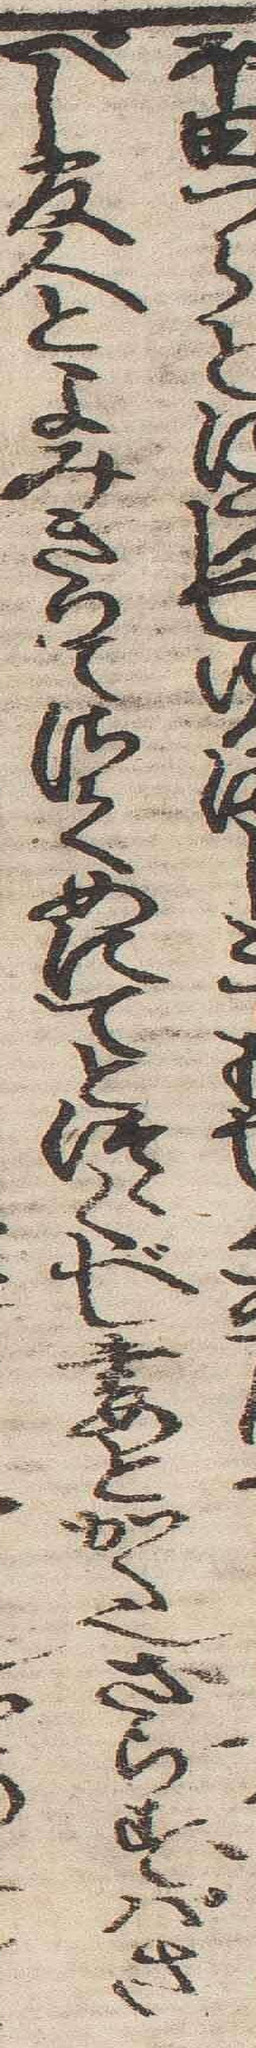べし官人とよみきりてさてめにてとつゝくべし妻とかく也さらすばさ
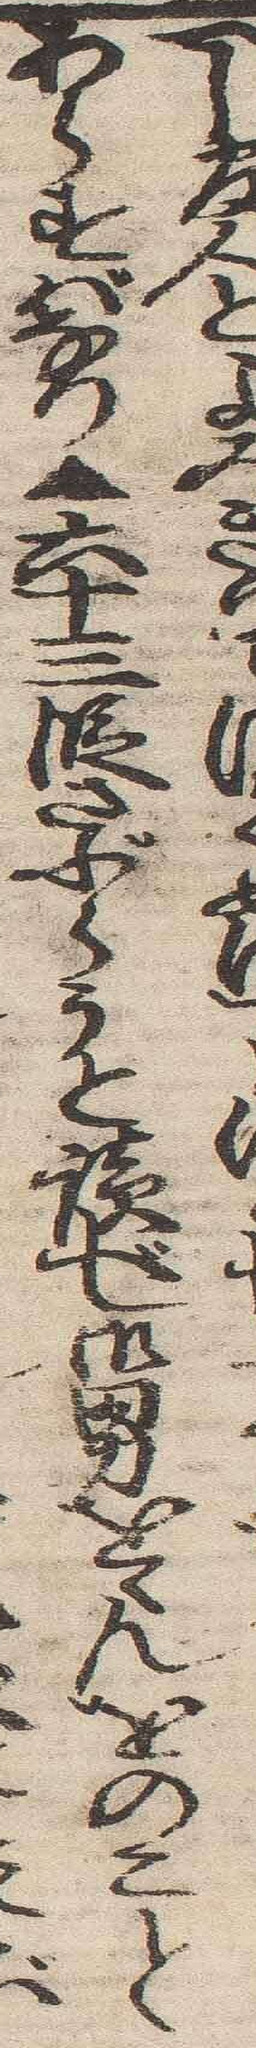あらすばなり▲六十三段さぶらうと読べし御男をゝんをのこと
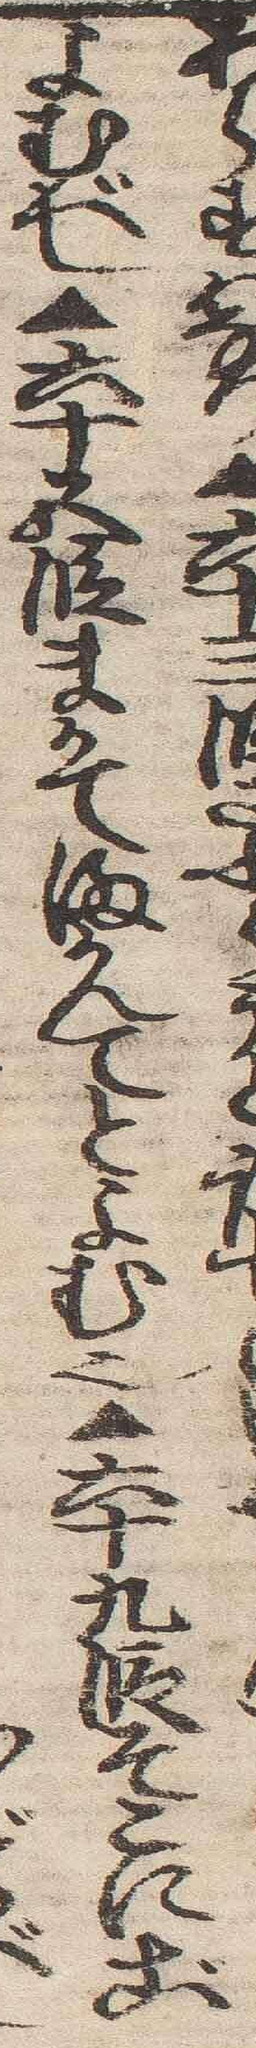よむべし▲六十五段まかてまかんてとよむ也▲六十九段そこにご
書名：伊勢物語
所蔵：東京学芸大学附属図書館 国文学研究資料館
